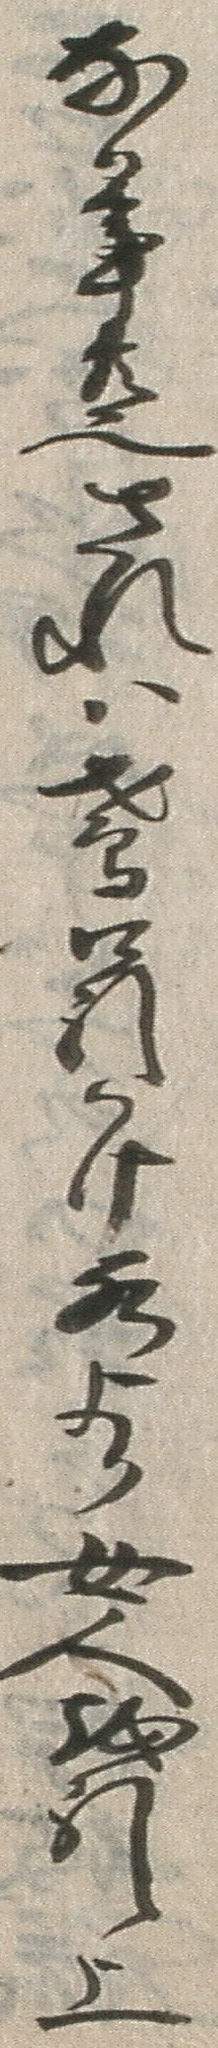なる事共也されは鳶口引かけ水より女人を引上
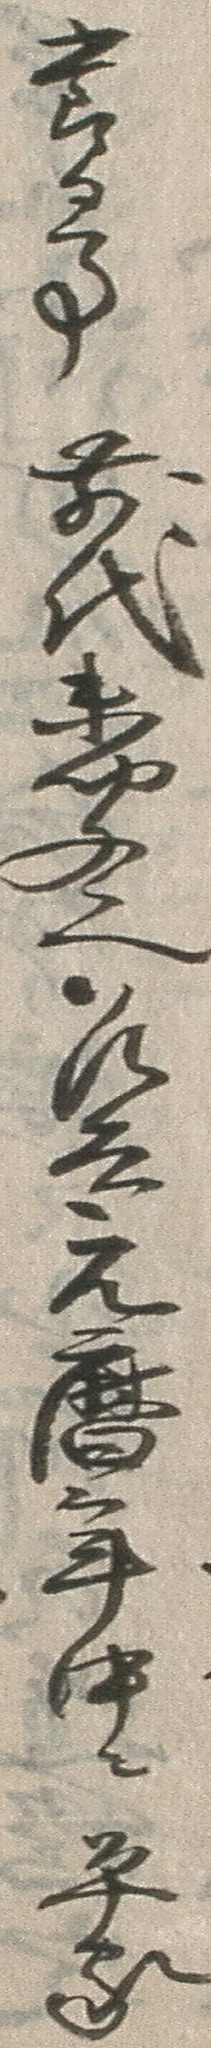たる事前代未聞也乍去元暦年中に平家
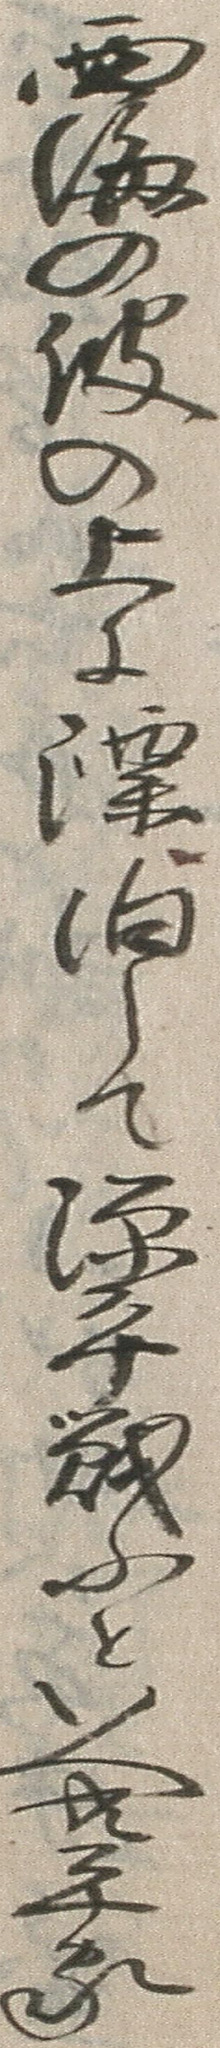西海の波の上に漂泊して源平戦ふといへ共平家
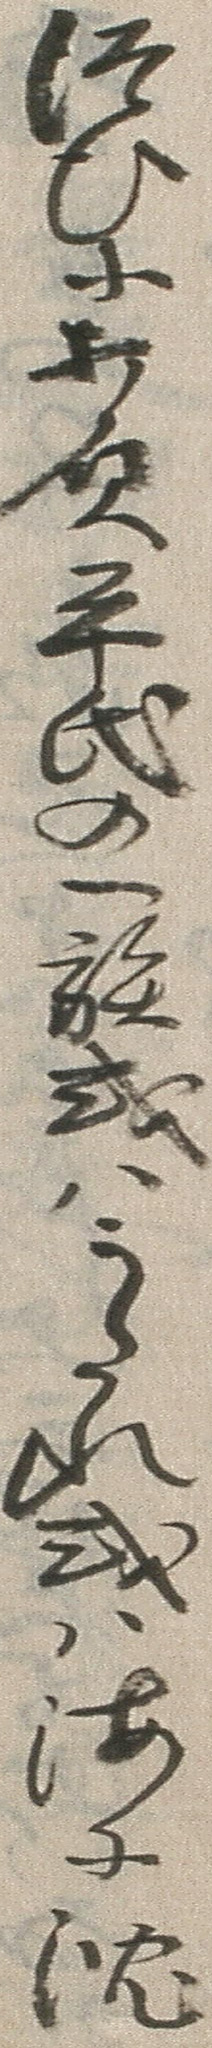つひに打負平氏の一族或はうたれ或は海に沈
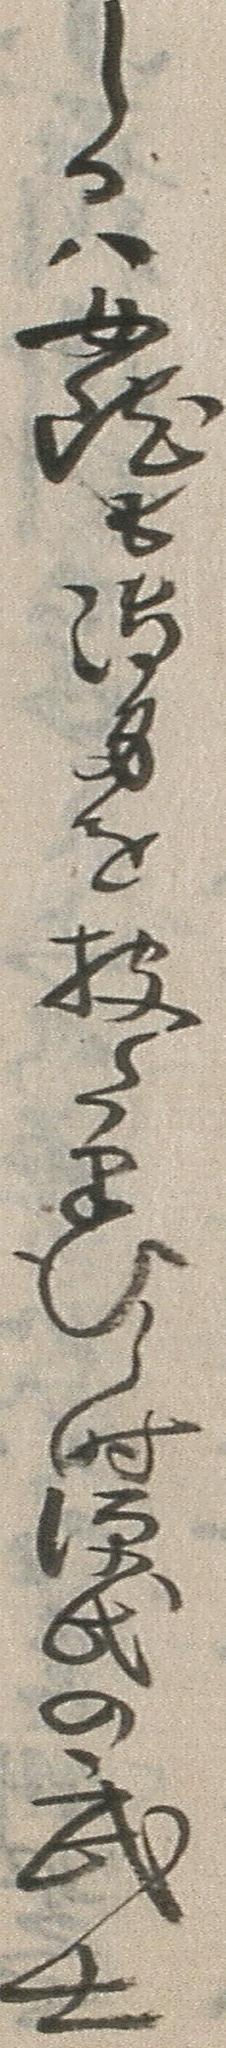しかは女院も御身を投たまひし時源氏の武士
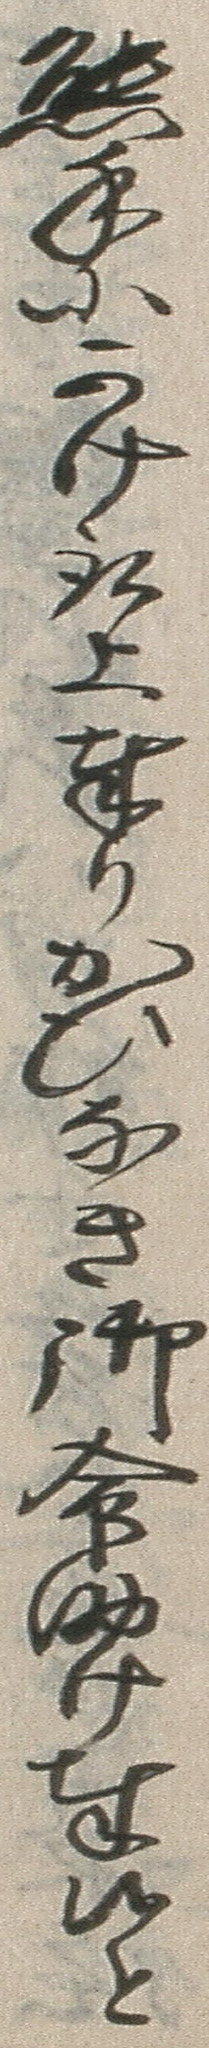熊手にかけ取上奉りかひなき御命助け奉候と
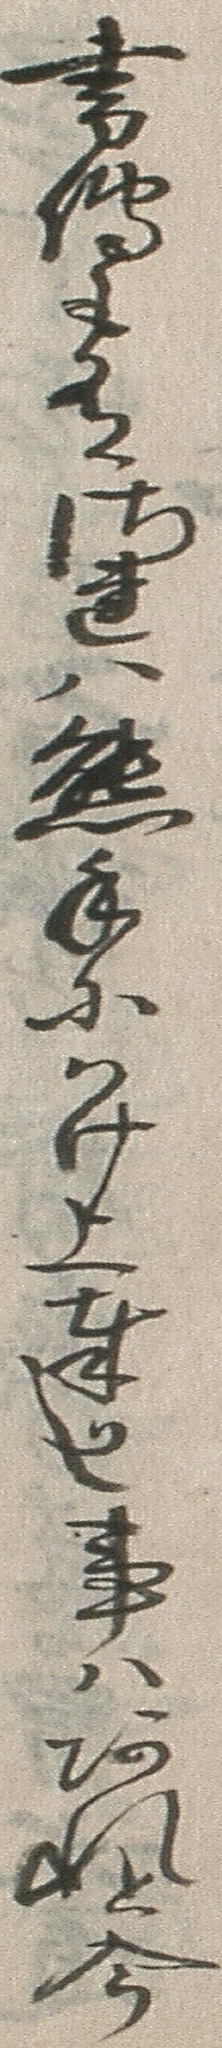書伝も有されは熊手にかけ上奉りし事はあれと今
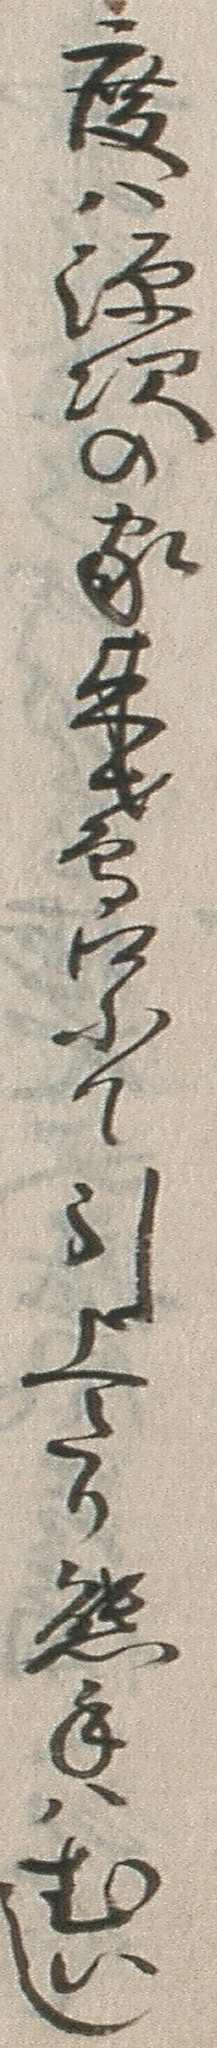度は源次の家来鳶口にて引上たり熊手はむいし
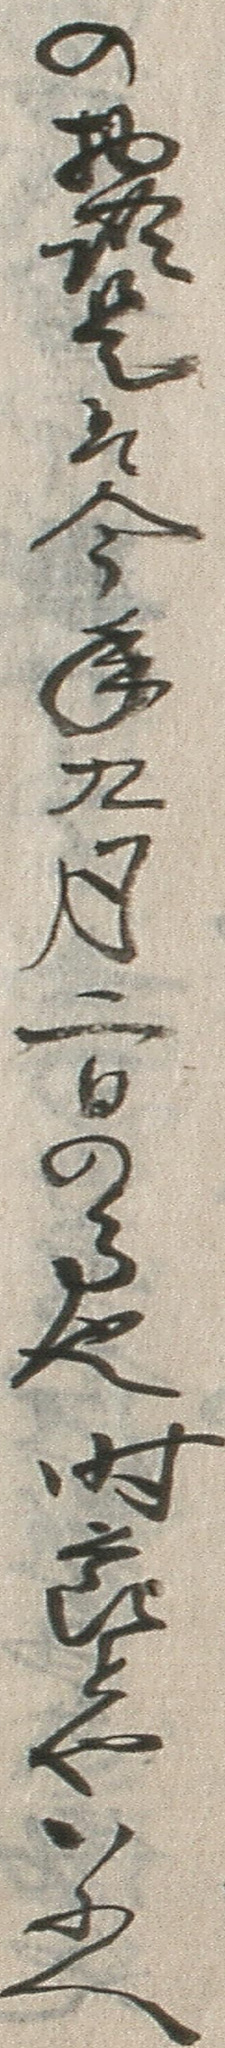の物語是は今年九月二日の事也時節とやいふへ
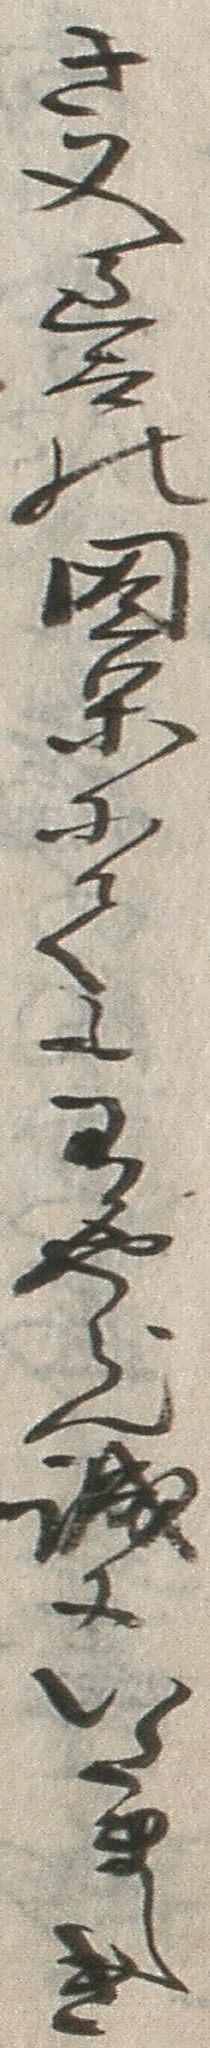き又過去の因果にても有やらん誠にいたましき
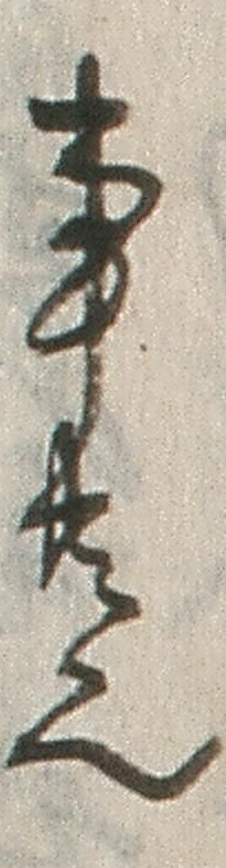事共也
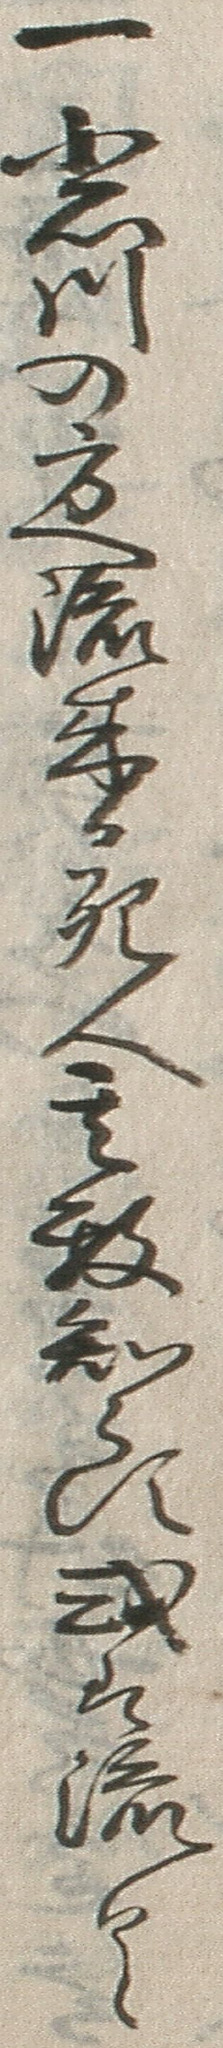一小石川の方へ流来る死人其数知らず或は流るゝ
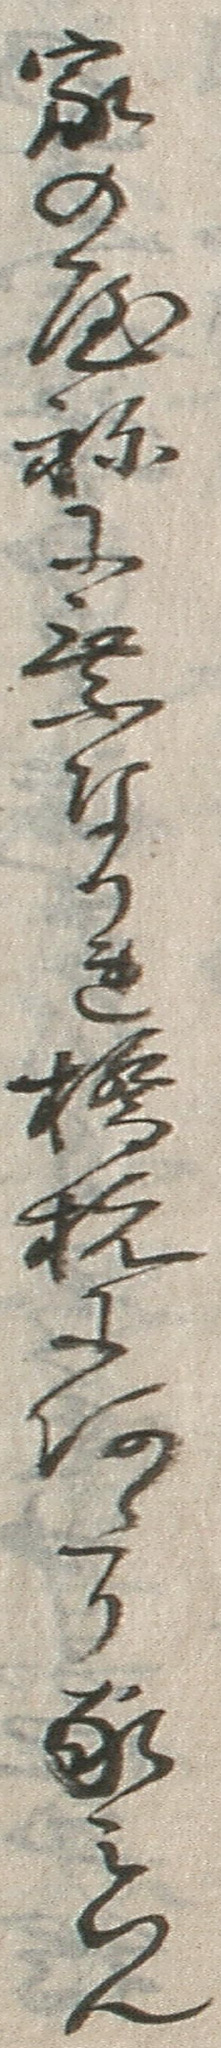家の屋ねに乗なかれ橋杭にあたり家みい？ん
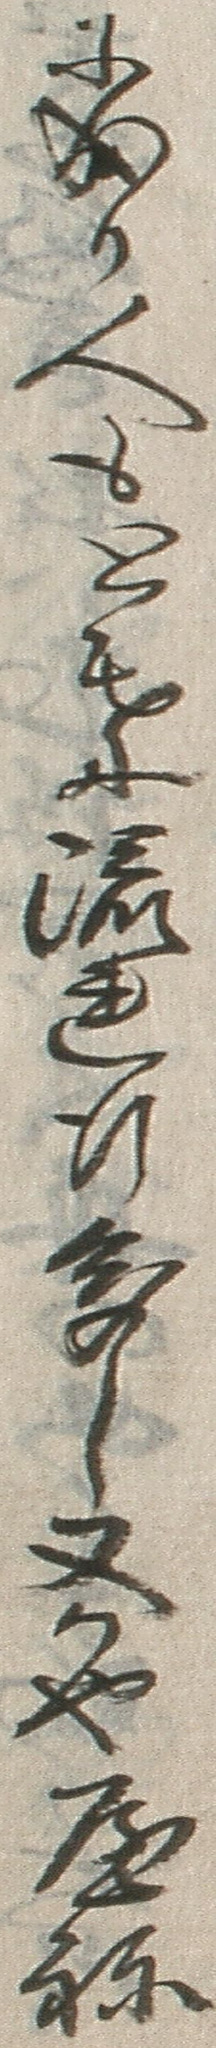に成り人もともに流れ行多し又かや屋ね

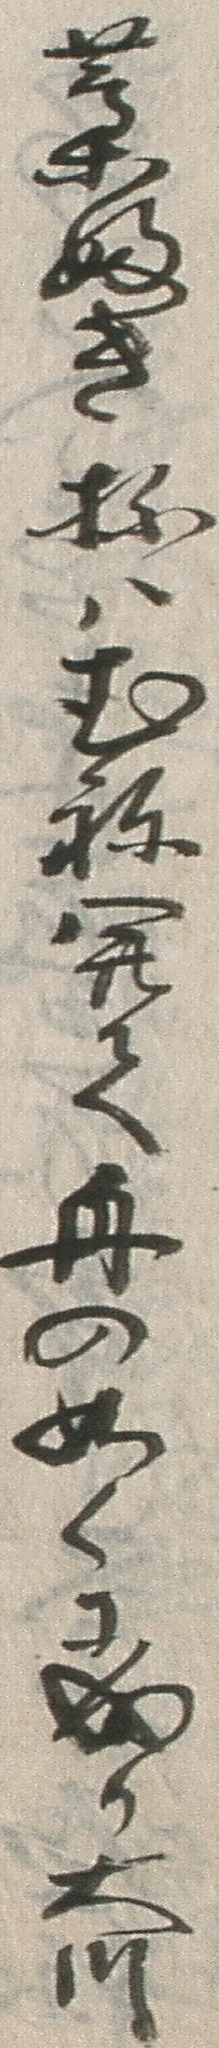藁ふき抔はむね開て舟の如くに成り大川
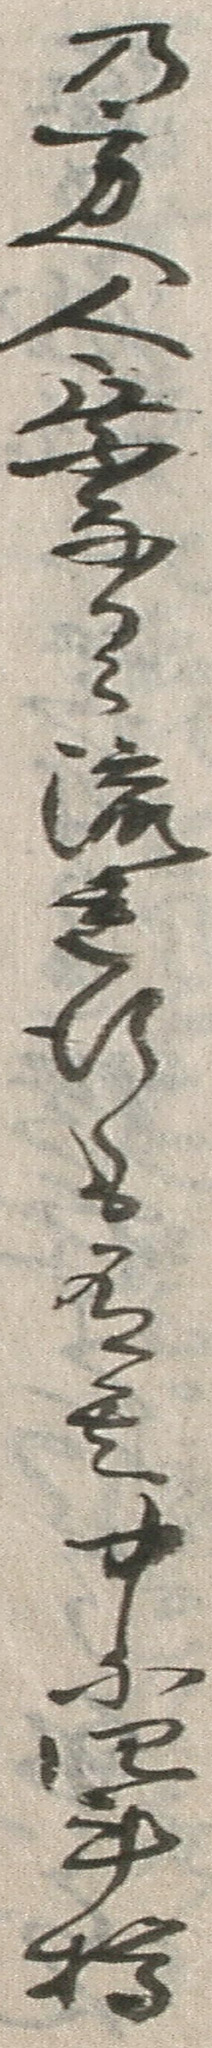の方へ人乗なから流れ行くも有其中に四斗樽
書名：享保十三年江戸洪水記
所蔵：東京大学地震研究所図書室 Earthquake Research Institute Library, The University of Tokyo, JAPAN
